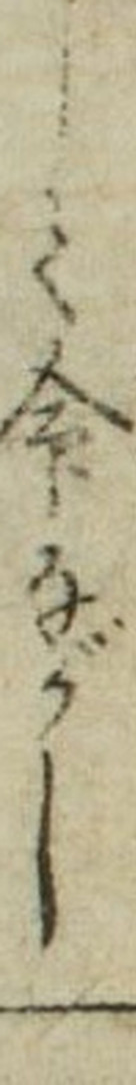して命ながし
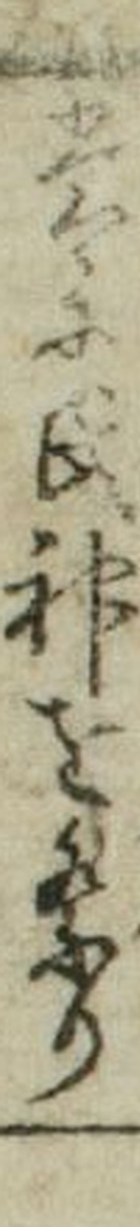常に氏神を祭り
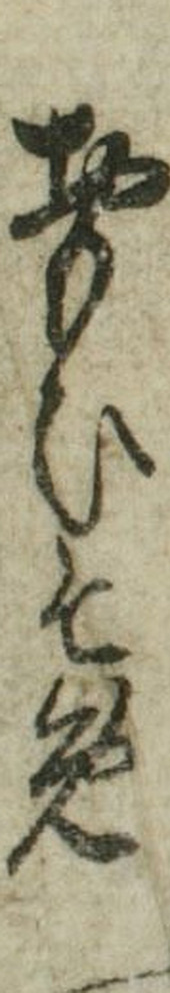おもひそめ
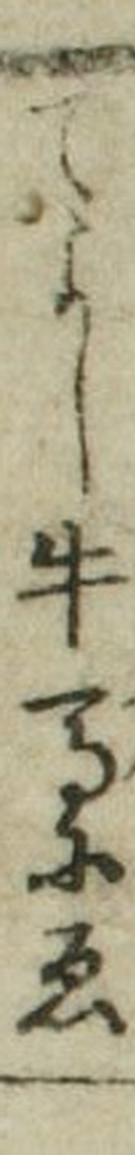てよし牛馬にゑ

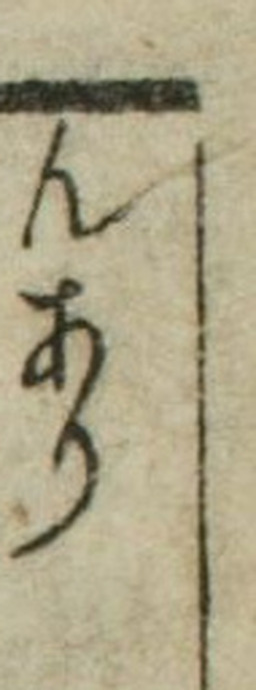んあり
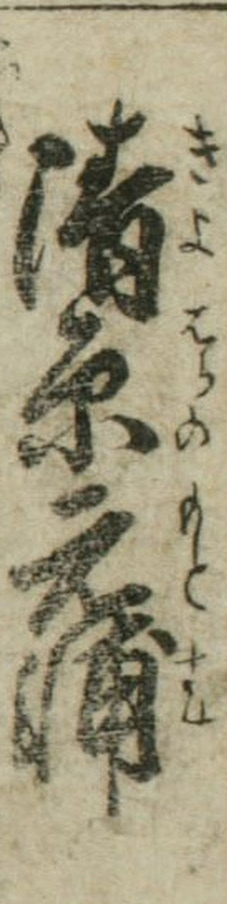清原元輔
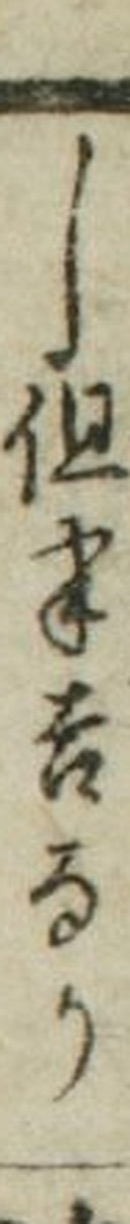し但半吉しなり
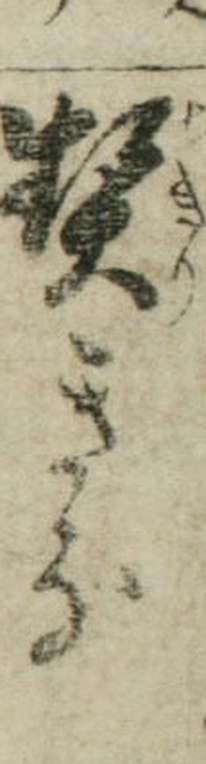契きな
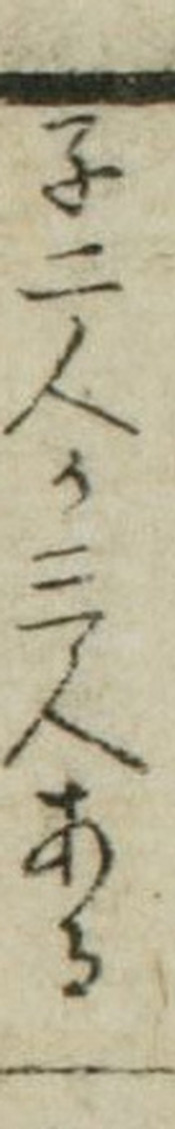子二人か三人ある
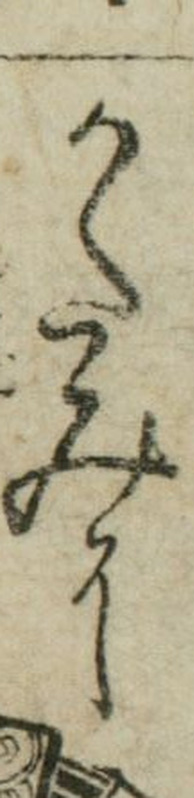かたみに
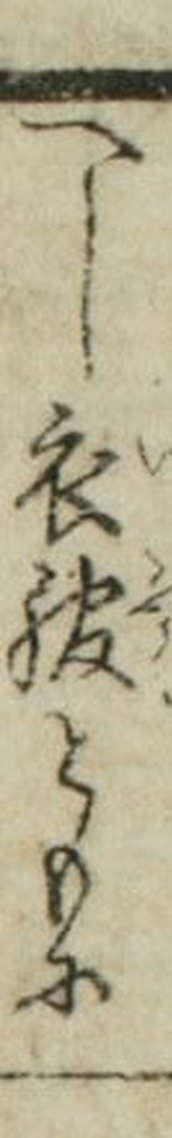へし衣服ともに
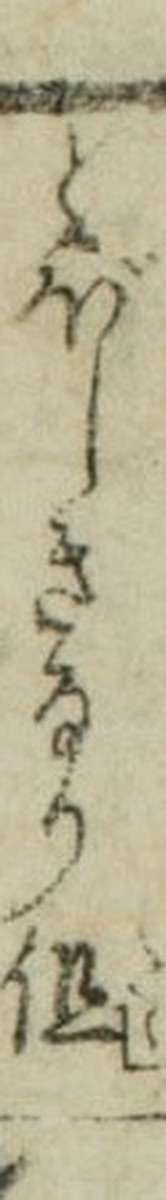とぼしきなり但
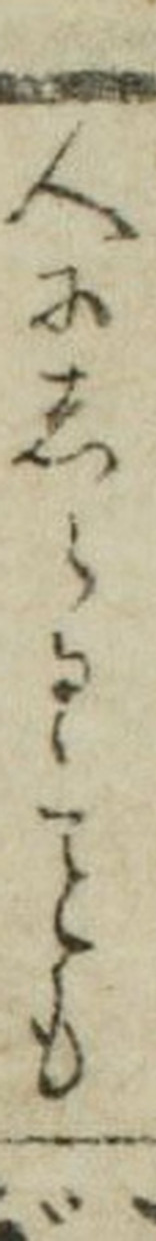人にしらるゝことも
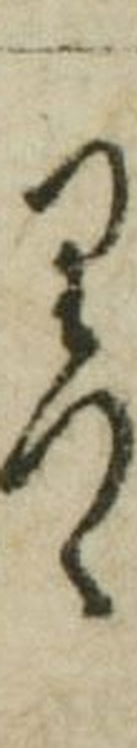りつゝ
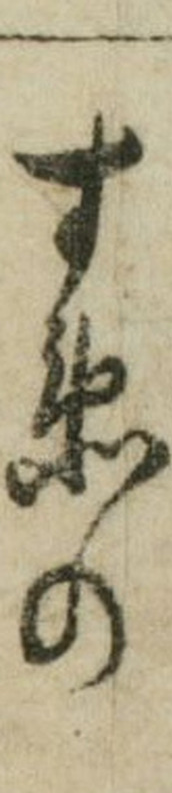すゑの
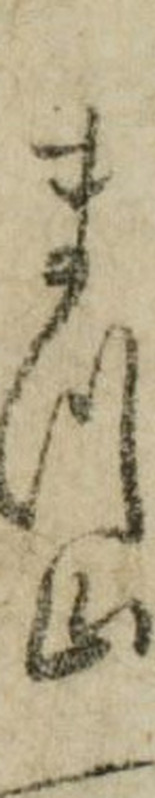まつ山
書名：百人一首
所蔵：東京学芸大学教育コンテンツアーカイブ
